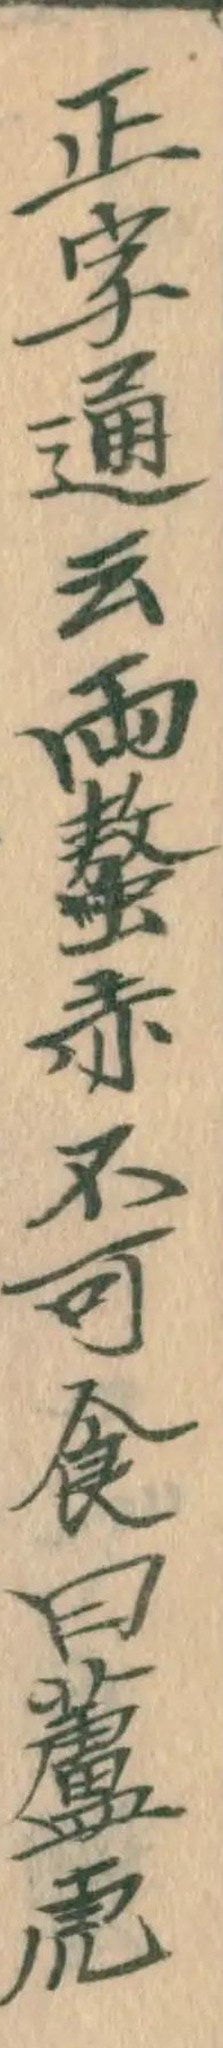正字通云両螯赤不可食曰蘆虎
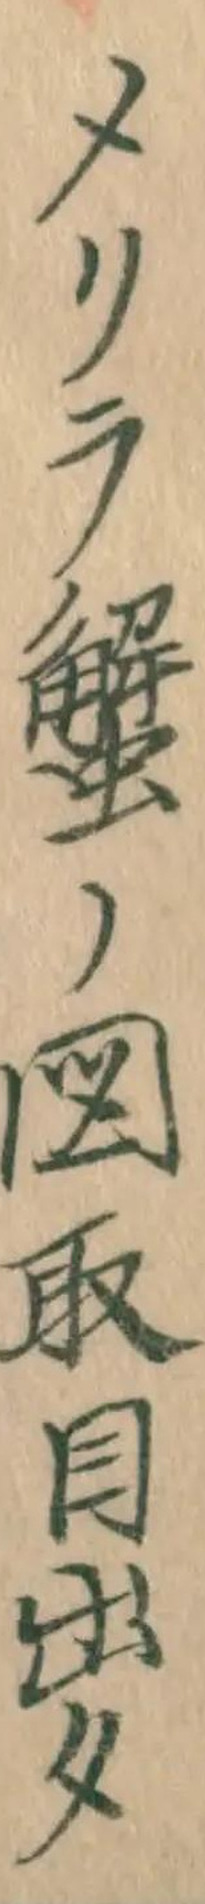メクラ蟹ノ図取目出タ
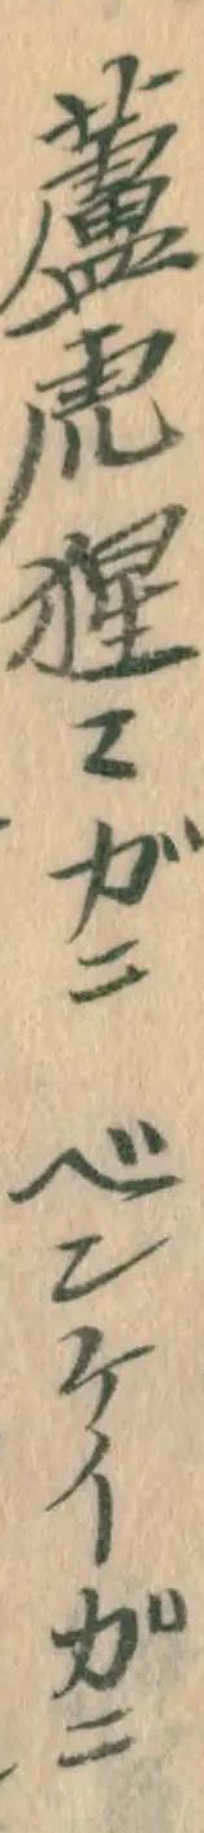蘆虎猩々ガニベンケイガニ
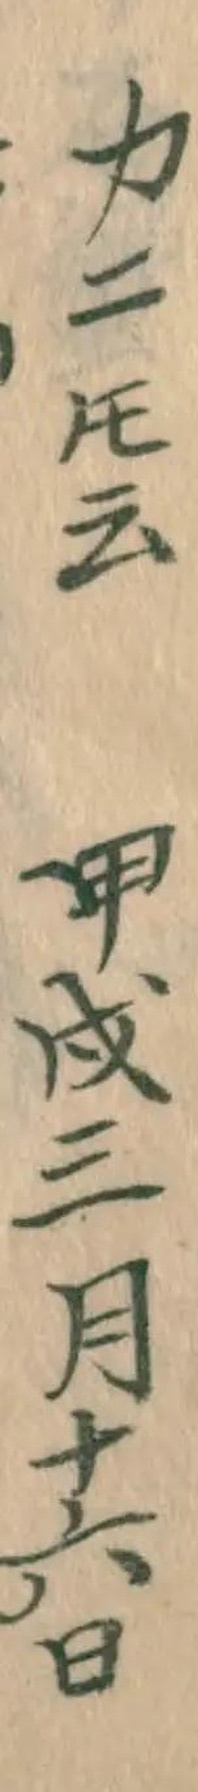カニトモ云甲戌三月十六日
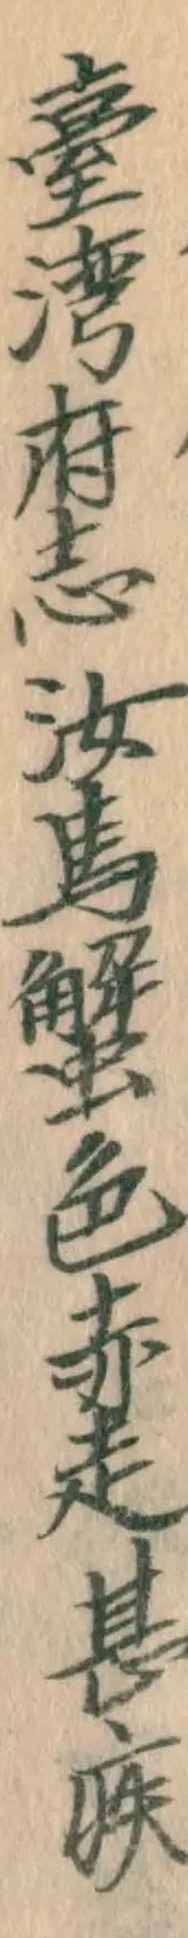臺湾府志汝馬蟹色赤走甚疾
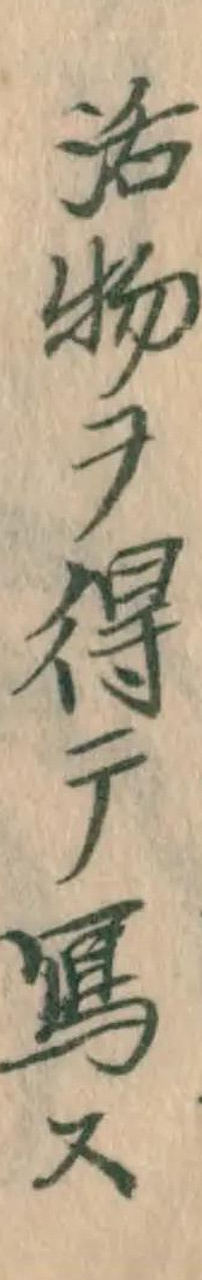活物ヲ得テ冩ス
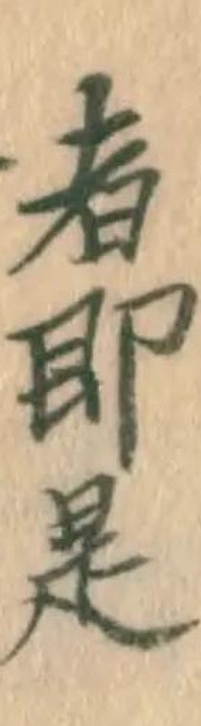者即是
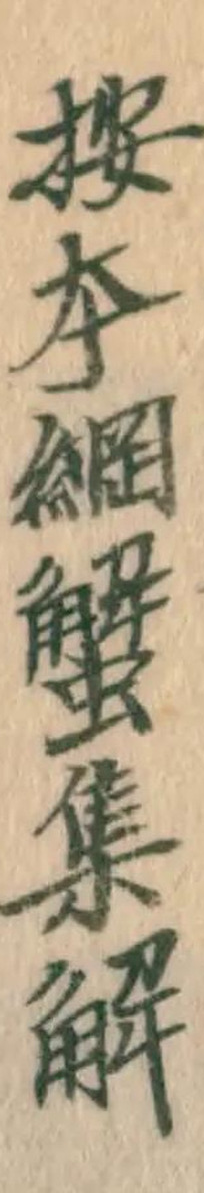按本綱蟹集解
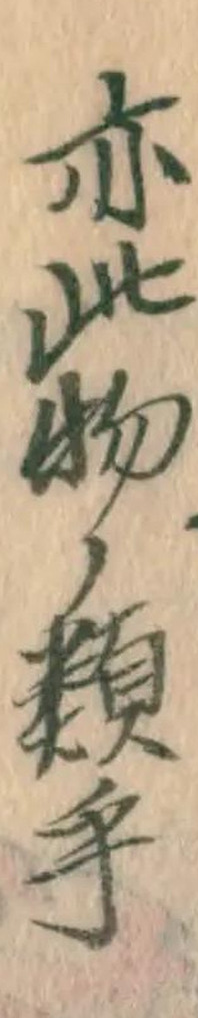亦此物ノ類乎
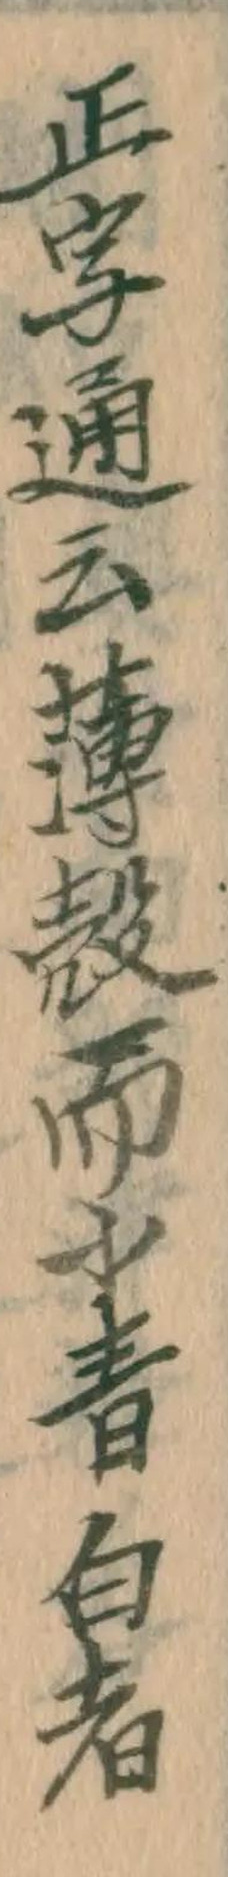正字通云薄殻而小青白者
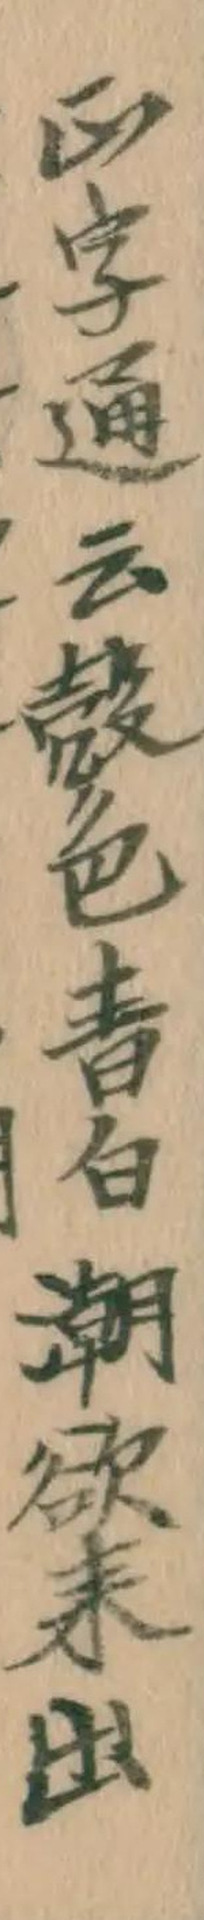招潮正字通云殻色青白潮欲来出
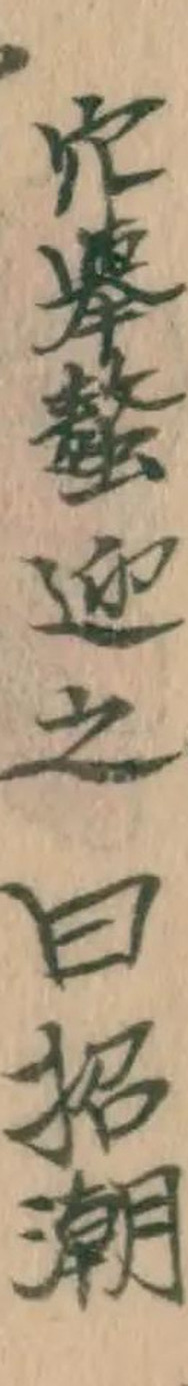穴挙螯迎之曰招潮
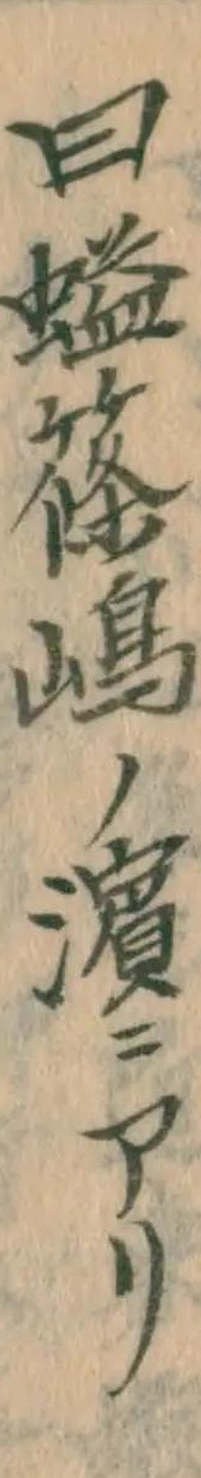曰螠篠嶋ノ濱ニアリ
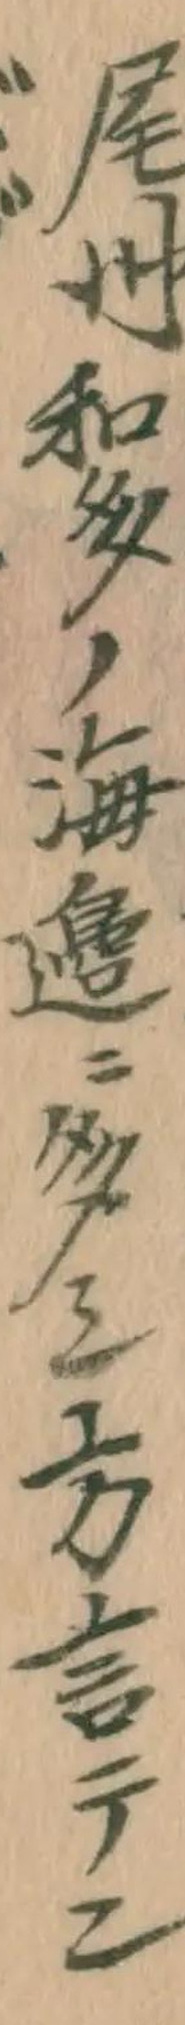尾州和多ノ海邉ニ多シ方言テン
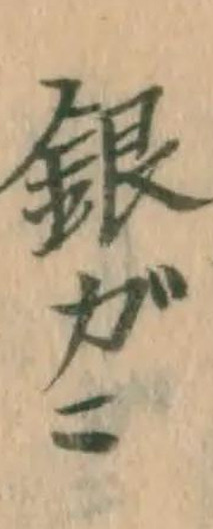銀ガニ
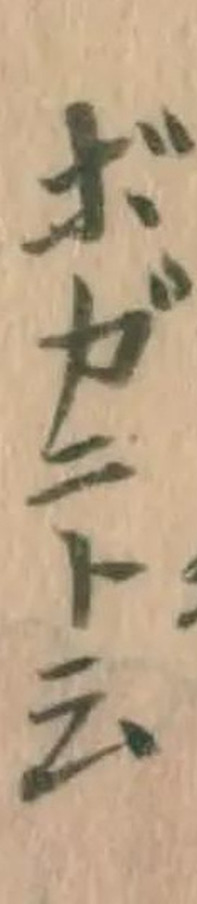ボガニト云
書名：千蟲譜 3巻. [2]
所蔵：国立国会図書館 National Diet Library, JAPAN
